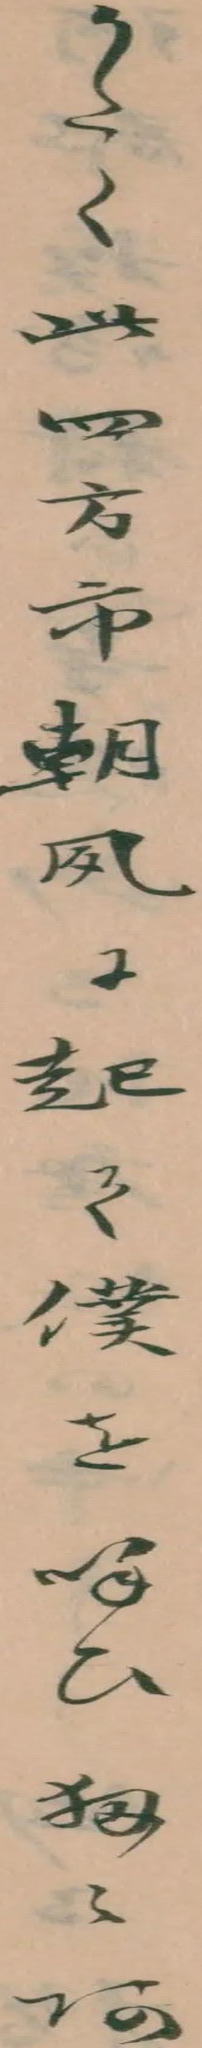かたく此四方市朝夙に起て僕を呼ひ扨々あ
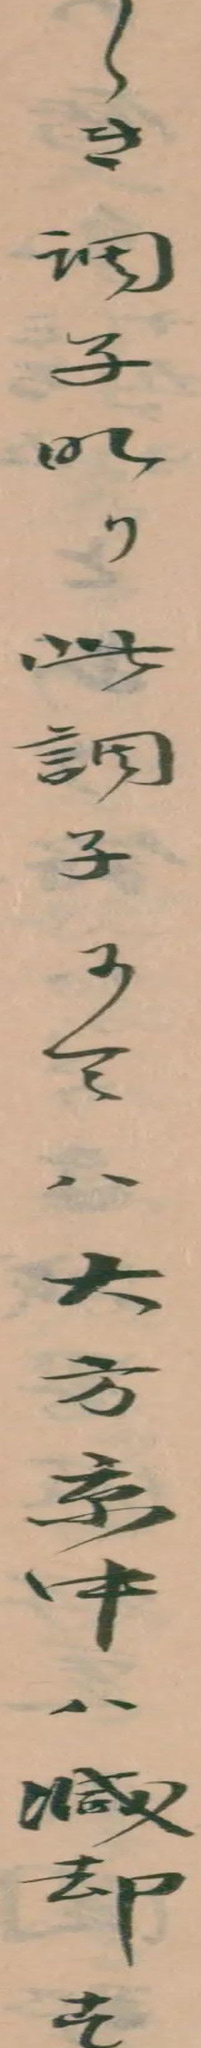しき調子なり此調子にては大方京中は減却す
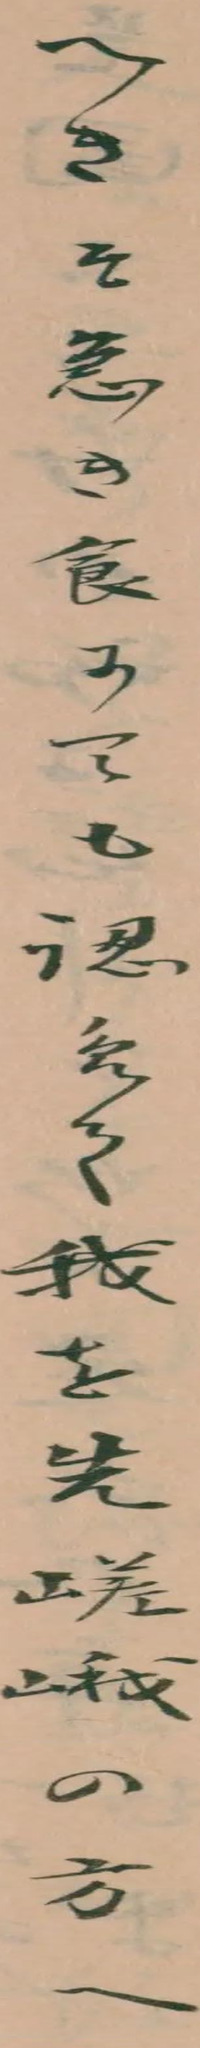へきそ急き食にても認めて我を先嵯峨の方へ
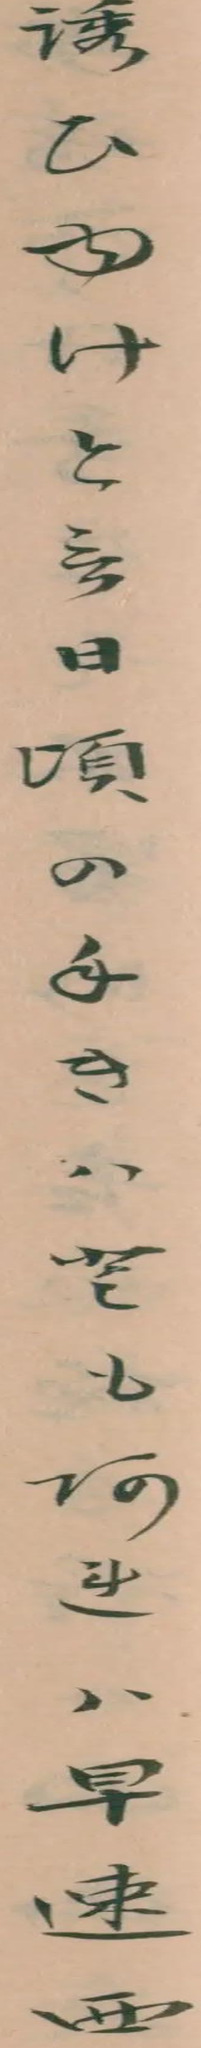誘ひゆけと言日頃の手きはともあれは早速西
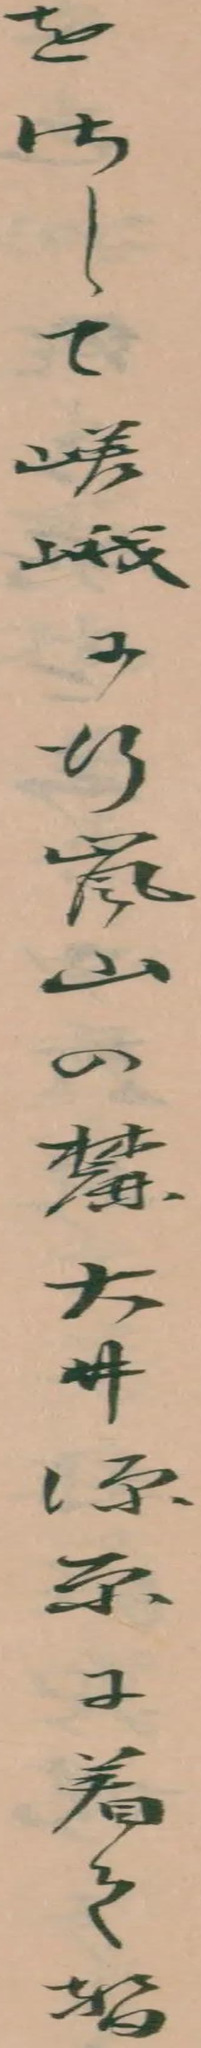をさして嵯峨に行嵐山の麓大井源原に着て暫
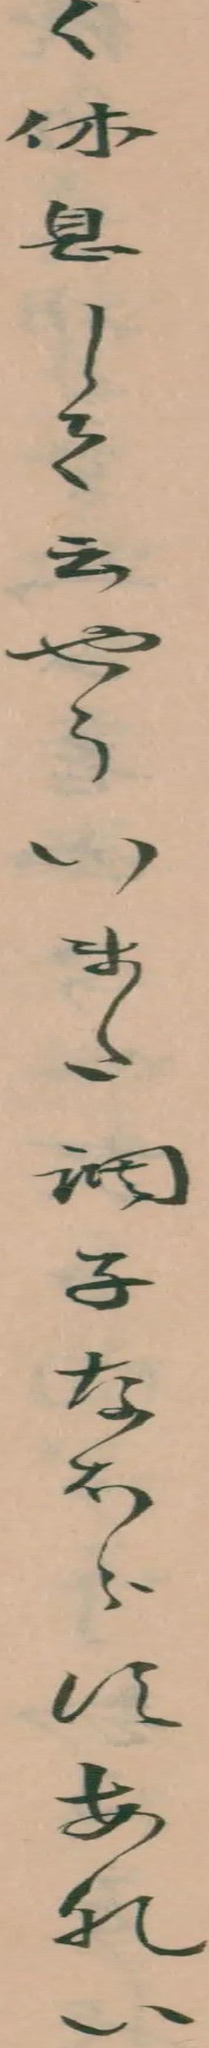く休息して云やういまた調子なほらすあない
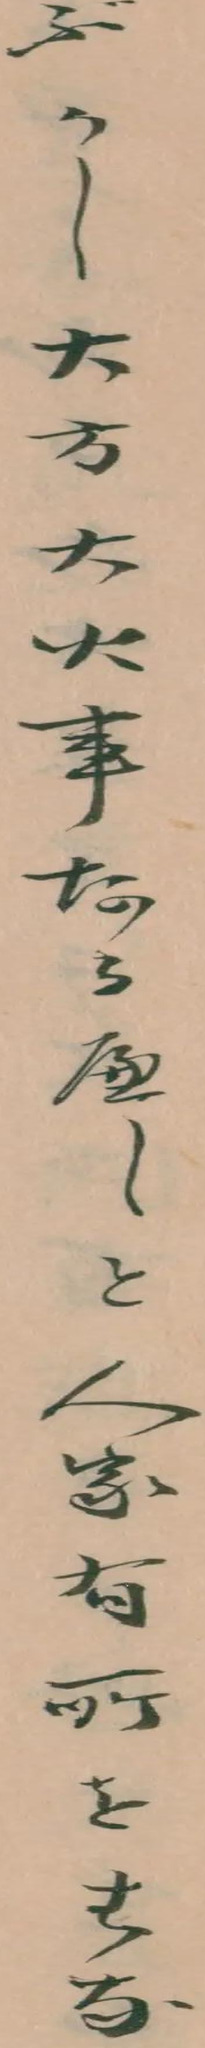ぶかし大方大火事なるへしと人家有所をはな
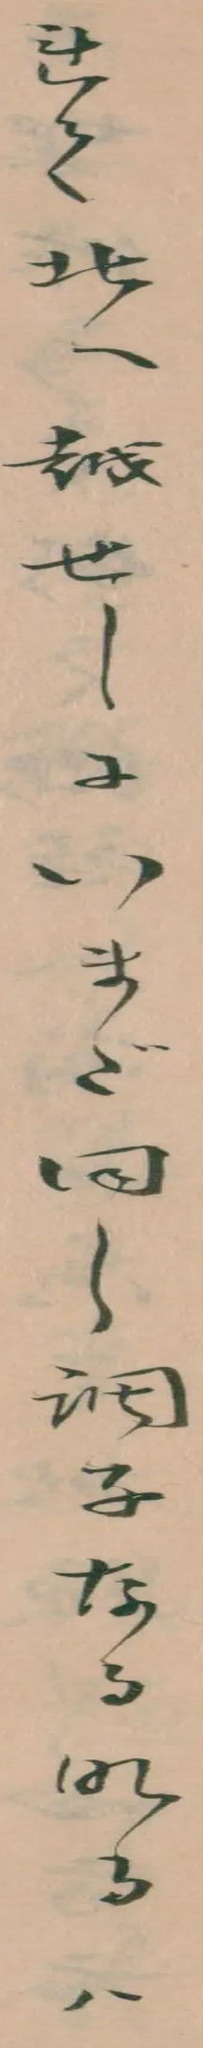れて北へ越せしにいまだ同し調子なるなるは
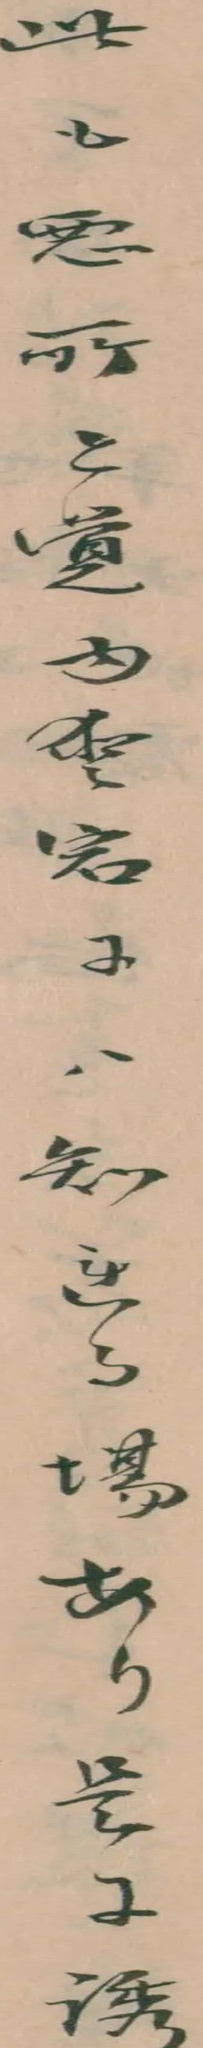此も悪所と覚ゆ愛宕には知れる場あり是に誘
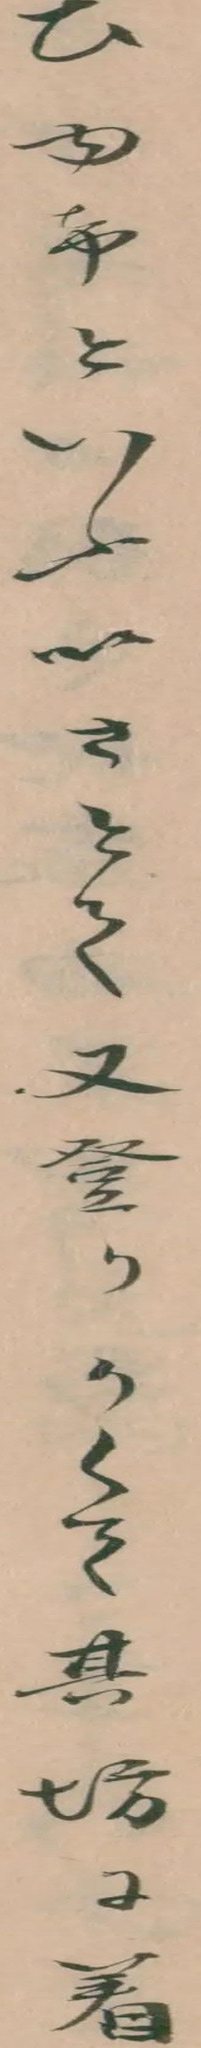ひゆけといふいさとて又登りかくて其坊に着
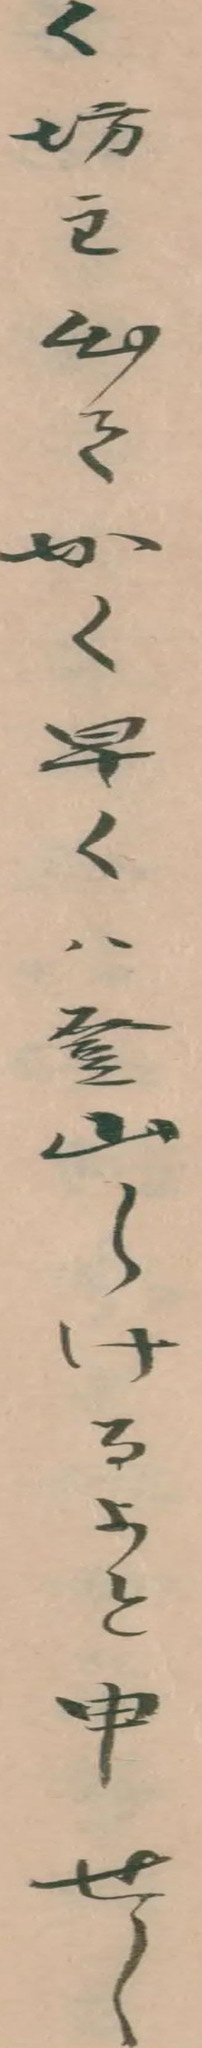く坊主出てかく早くは登山しけるよと申せし
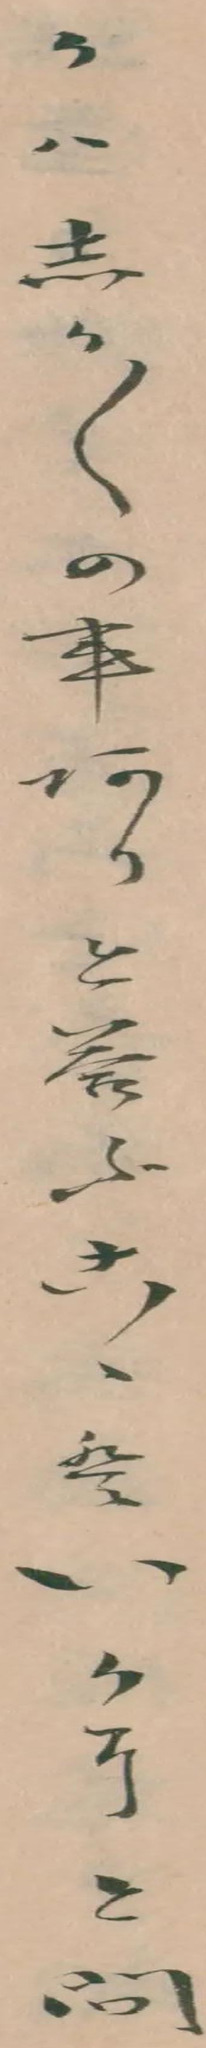かはしか〳〵の事ありと答ふこゝはいかにと問
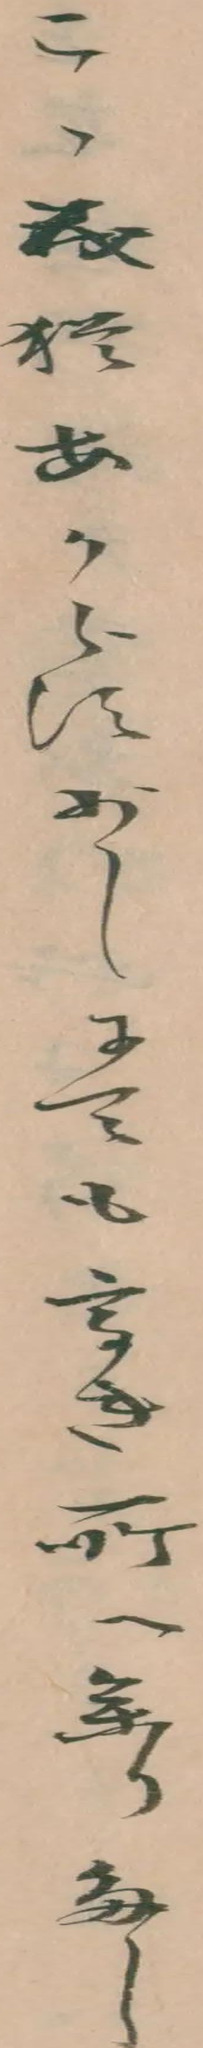こゝも猶あからす少しにても高き所へ参りたし

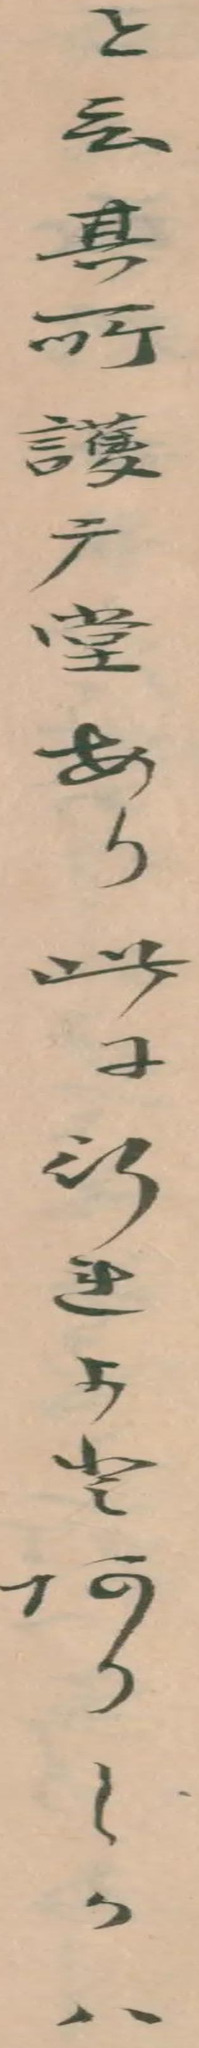と言其所護摩堂あり此に行れよとありしかは
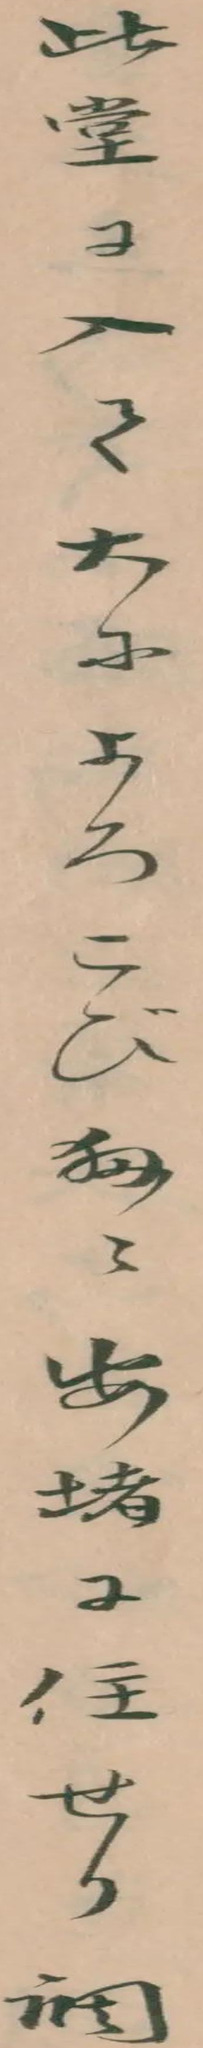此堂に入て大によろこび扨々安堵に住せり調
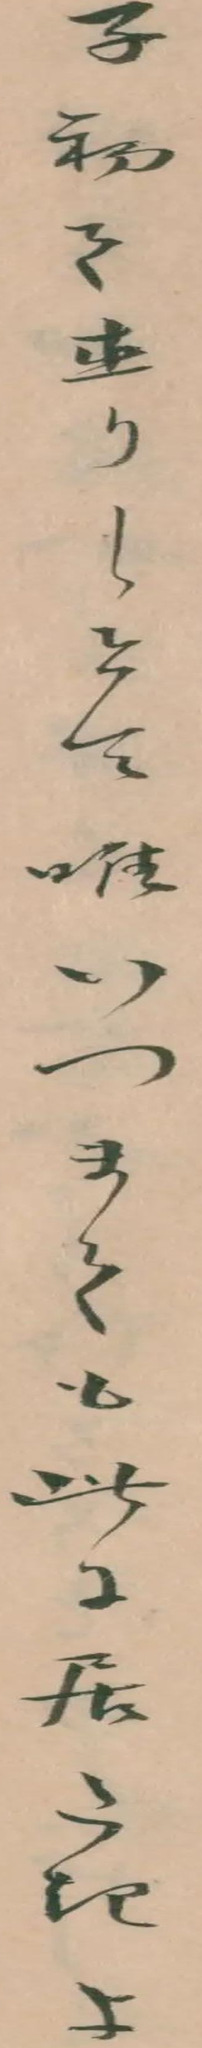子初て直りしとて唯いつまても此に居たきよ
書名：地災撮要. 巻5-6(地震之部)
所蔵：国立国会図書館 National Diet Library, JAPAN
